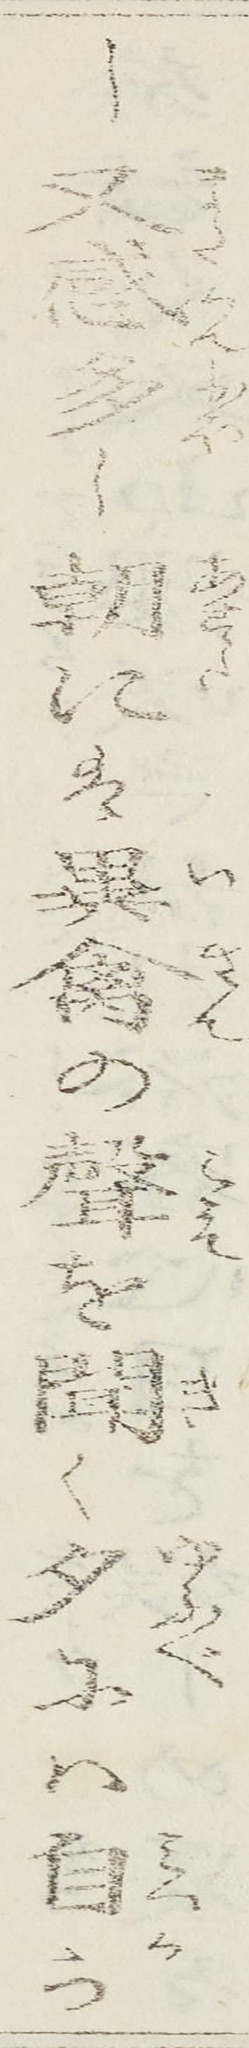し又感多し朝には異禽の声を聞く夕には自ら
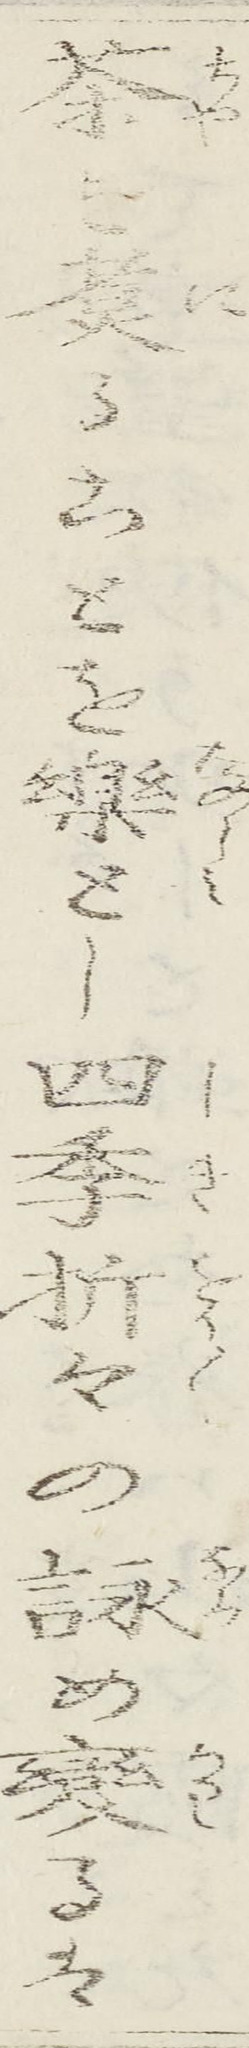茶は煮ることを楽とし四季折々の詠め変るは
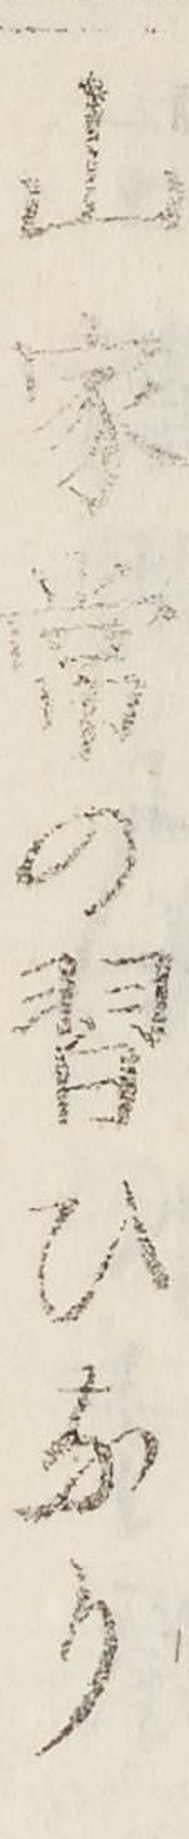山家常の習ひなり
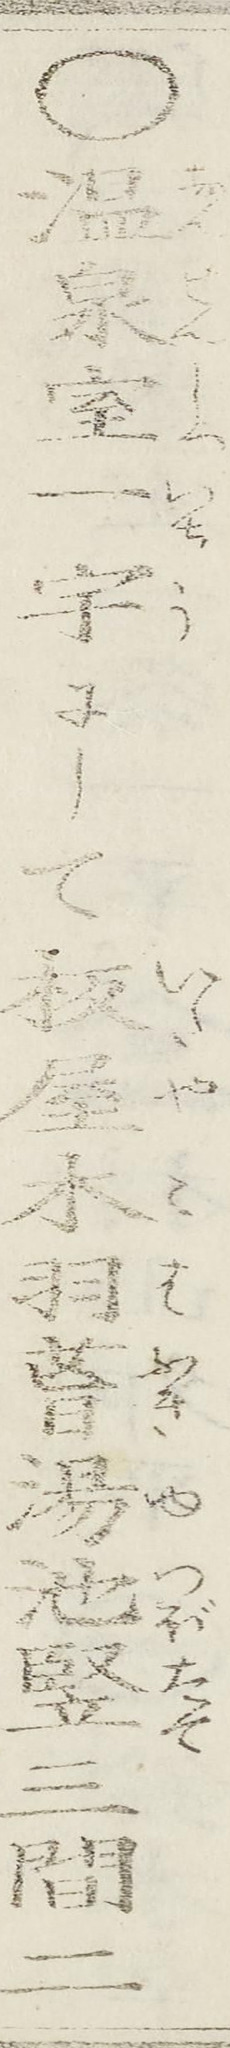○温泉室一宇にして板屋小羽葺湯池竪三間二
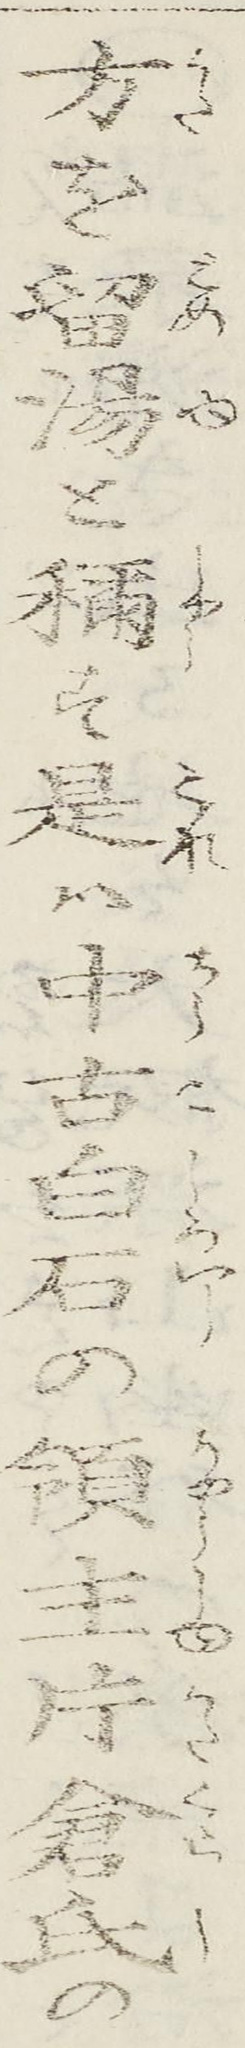方を留湯と称す是は中古白石の領主の片倉氏の
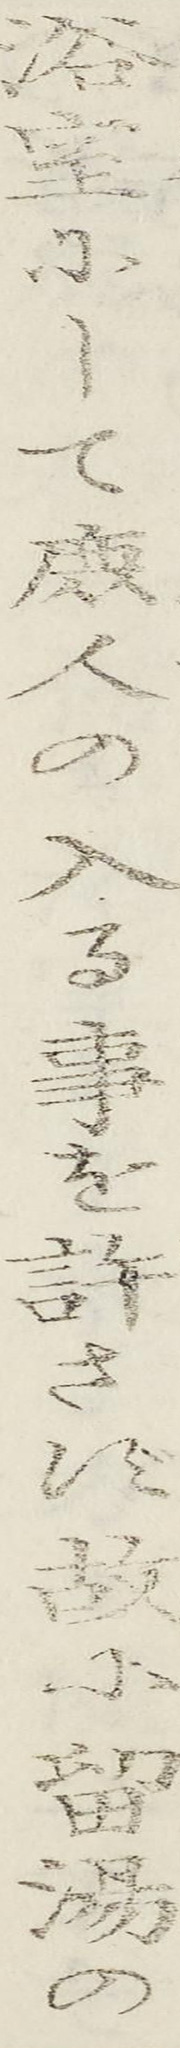浴室にして庶人の入る事を許さず故に留湯の
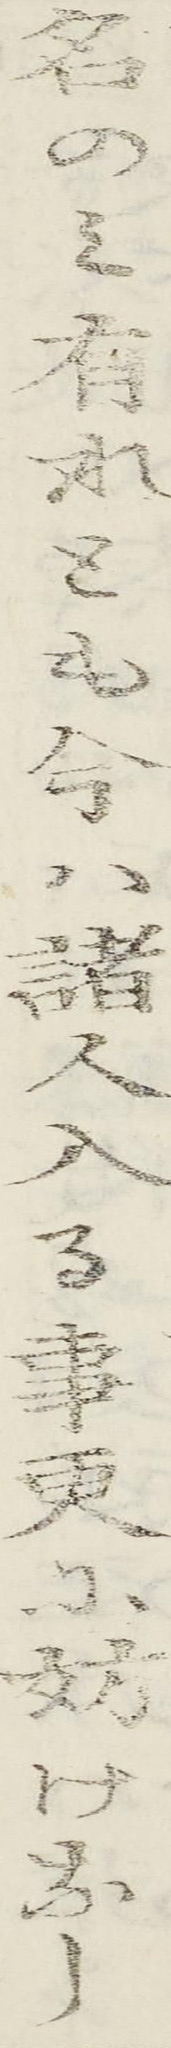名のみ有れとも今は諸人入る事更に妨げなし
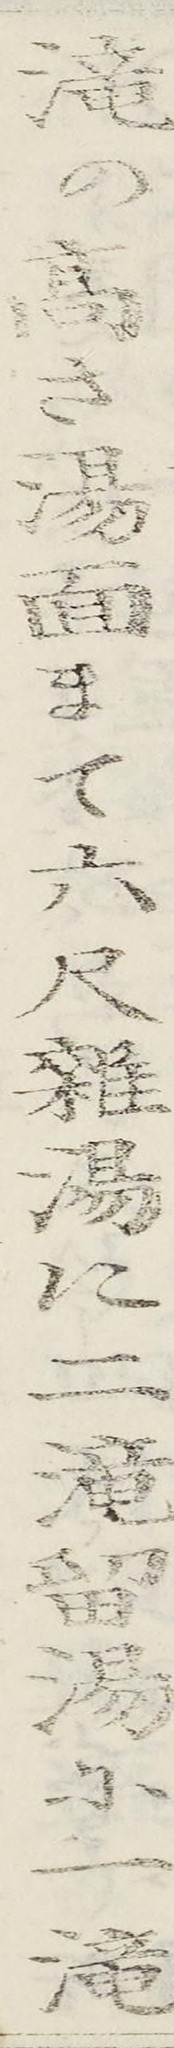滝の高き湯面まて六尺雑湯に二滝留湯に一滝
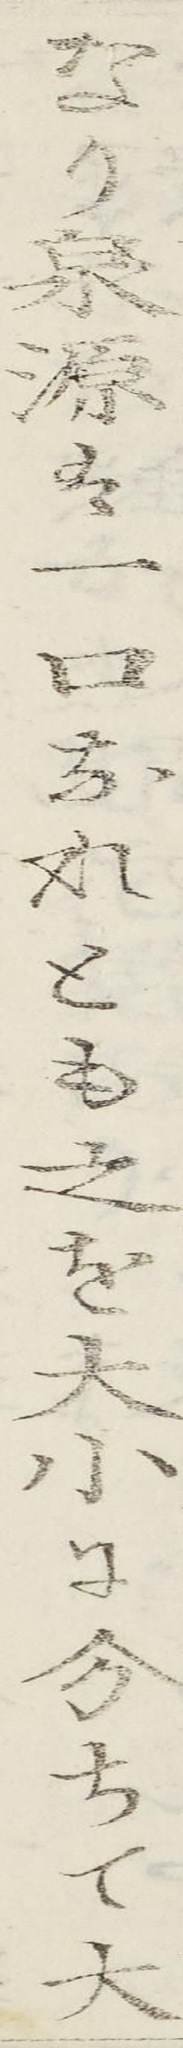なり泉源は一口なれとも之を大小に分ちて大
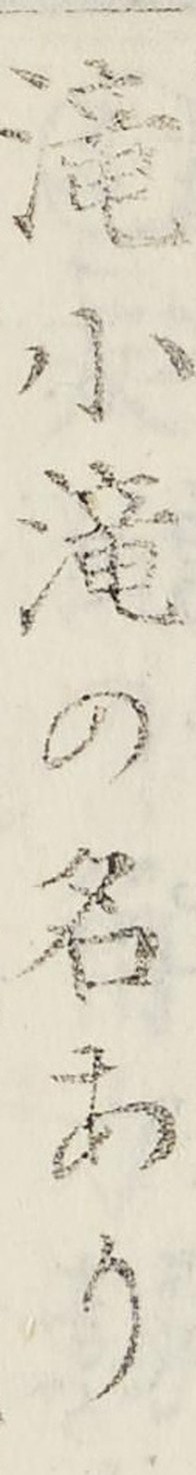滝小滝の名あり
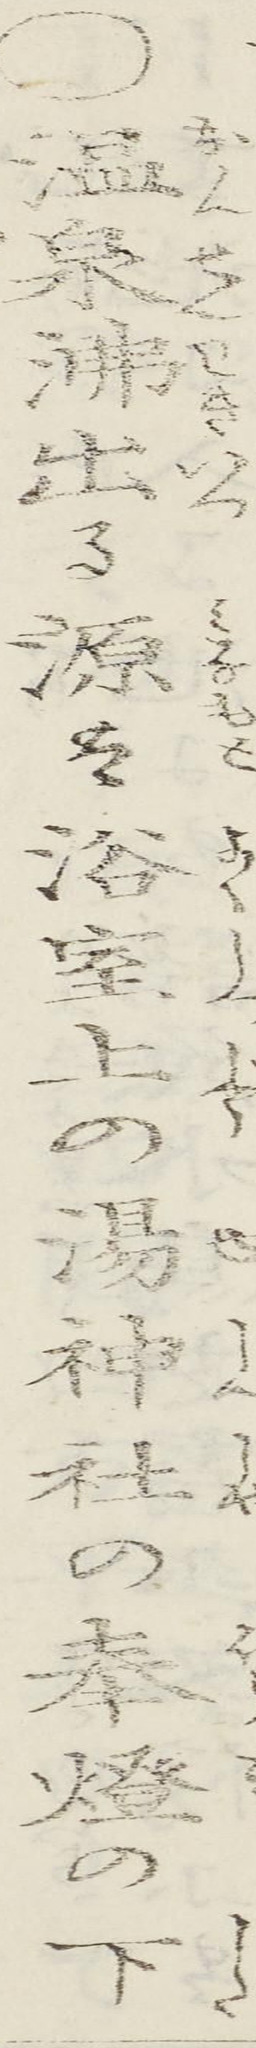○温泉沸出る源は浴室上の湯神社の法灯の下
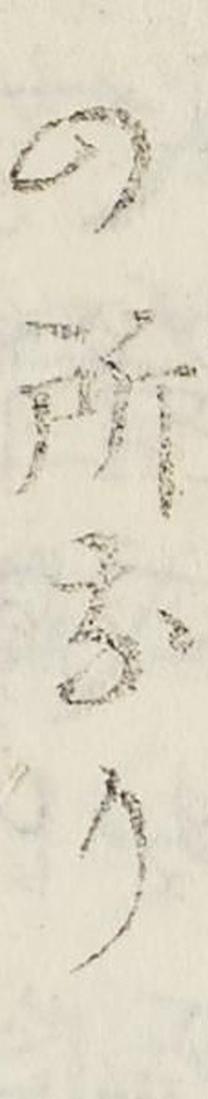の所なり
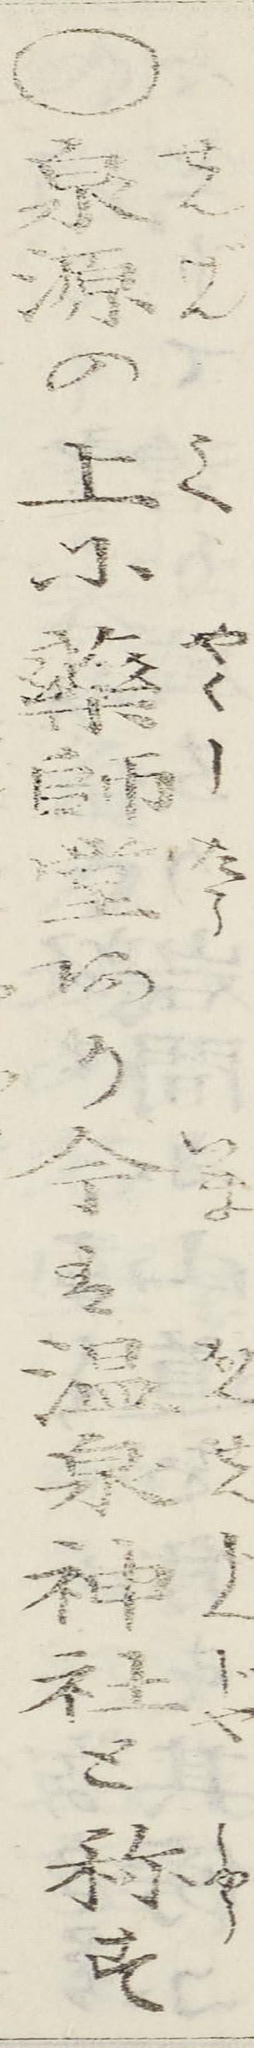○泉源の上に薬師堂あり今は温泉神社と称す
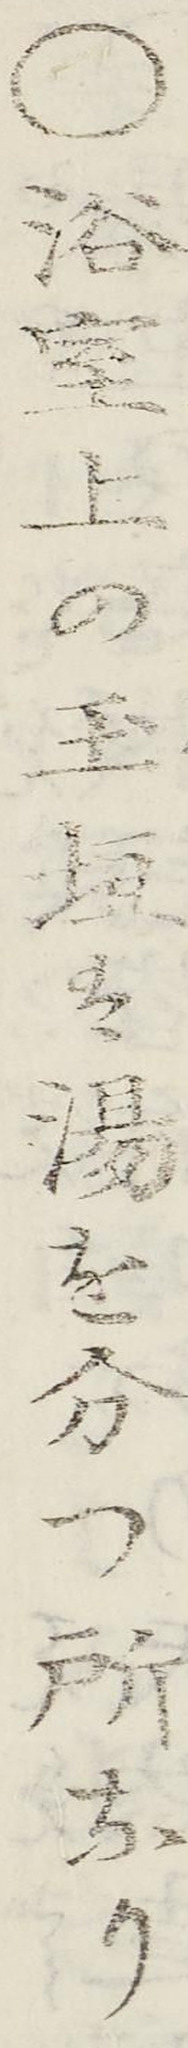○浴室上の玉垣は湯を分つ所なり

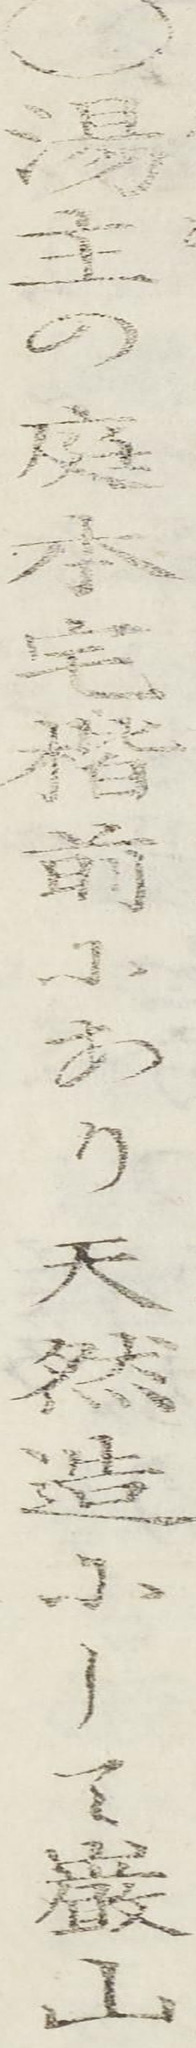○湯主の底本宅楷前にあり天然造にして巌山
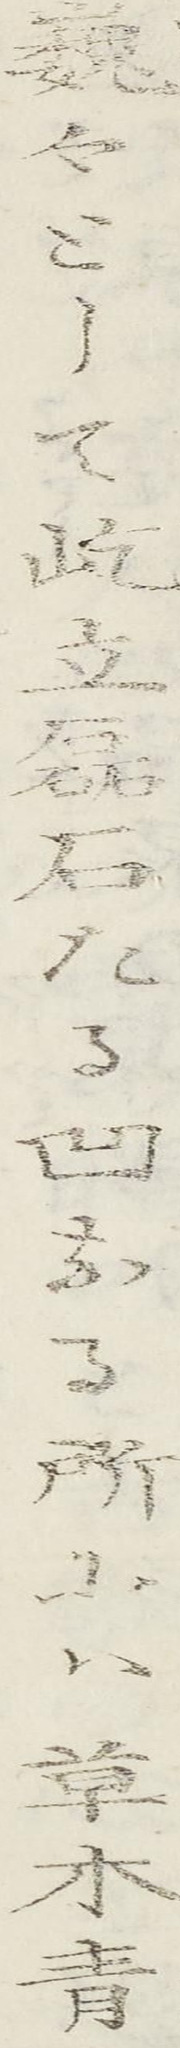巍々として屹立磊石たる凹なる所には草木青
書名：鎌先温泉由來記
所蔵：東京大学地震研究所図書室 Earthquake Research Institute Library, The University of Tokyo, JAPAN
